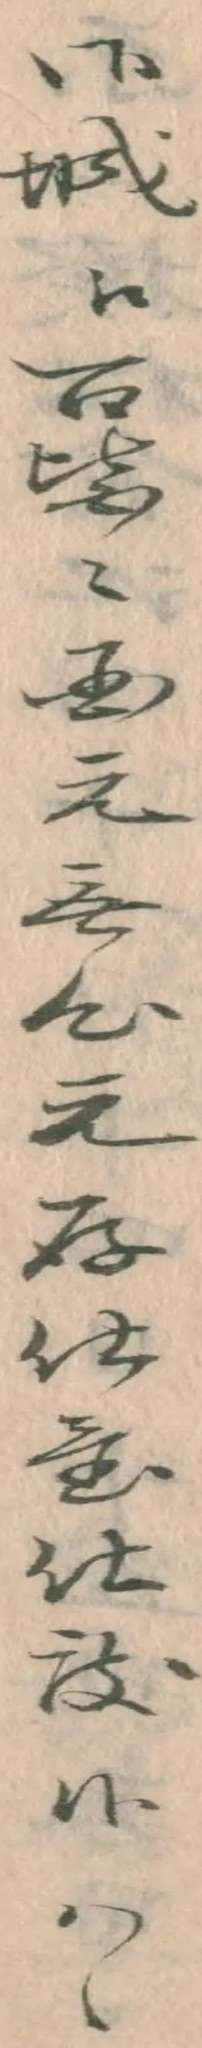御城江召皆々国元無心元存仕置仕度候はゝ
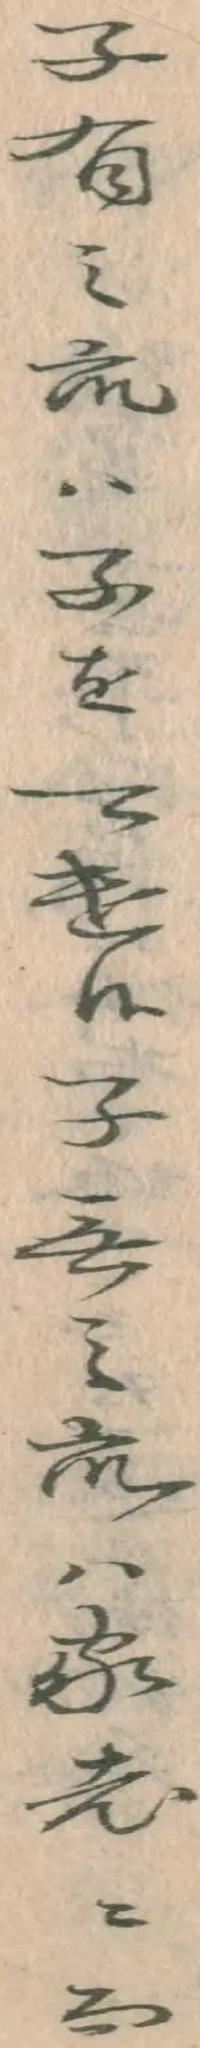子有之衆は子を可遣候子無之衆は家老に而
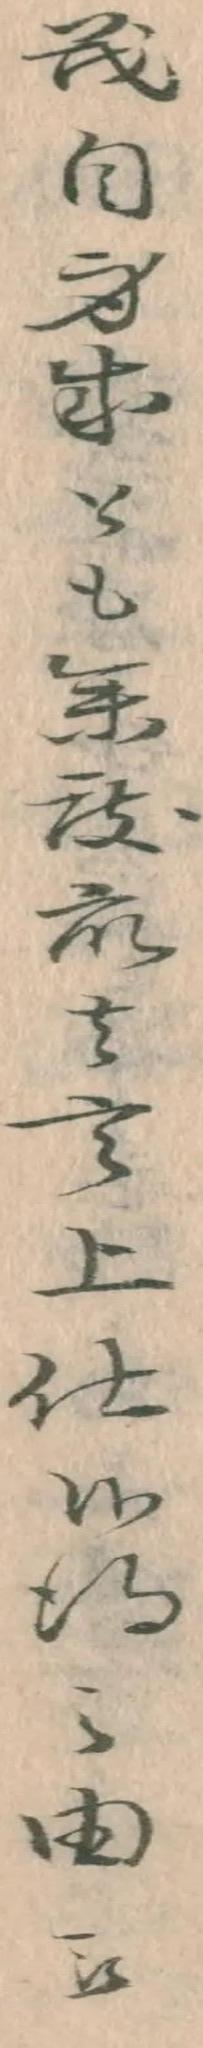義自身成とも参度衆者言上仕候得之由被
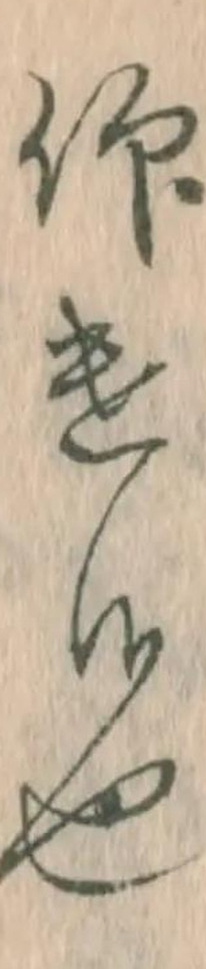仰遣候也
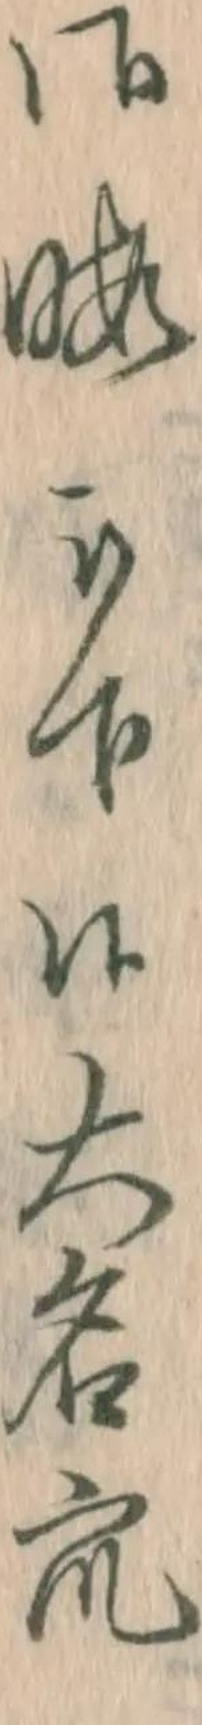御暇被下候大名衆
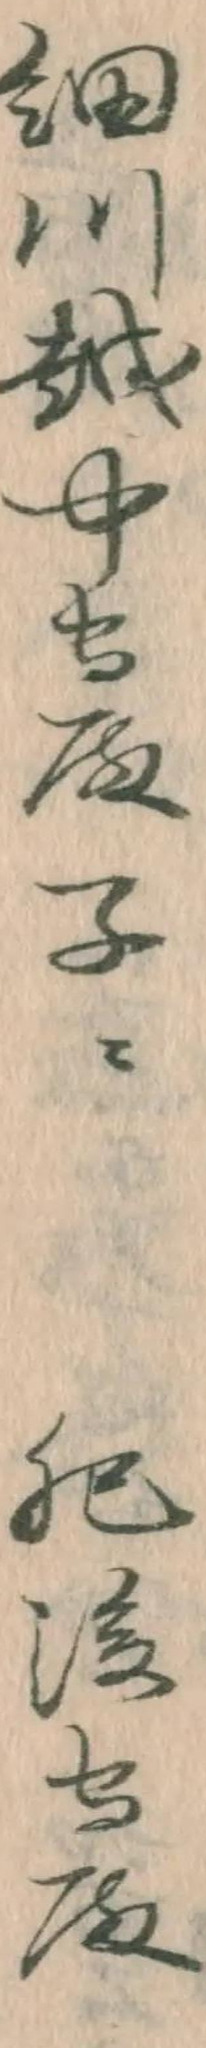細川越中守殿子に肥後守殿
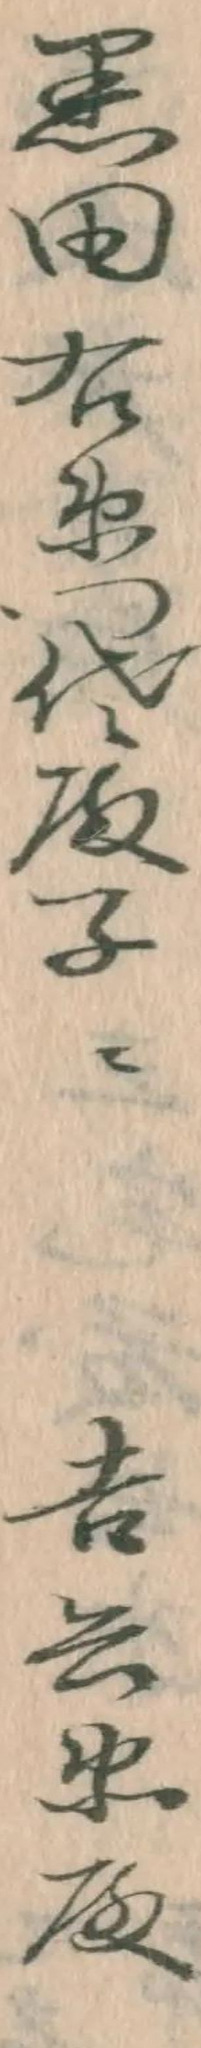黒田右衛門佐殿子に吉兵衛殿
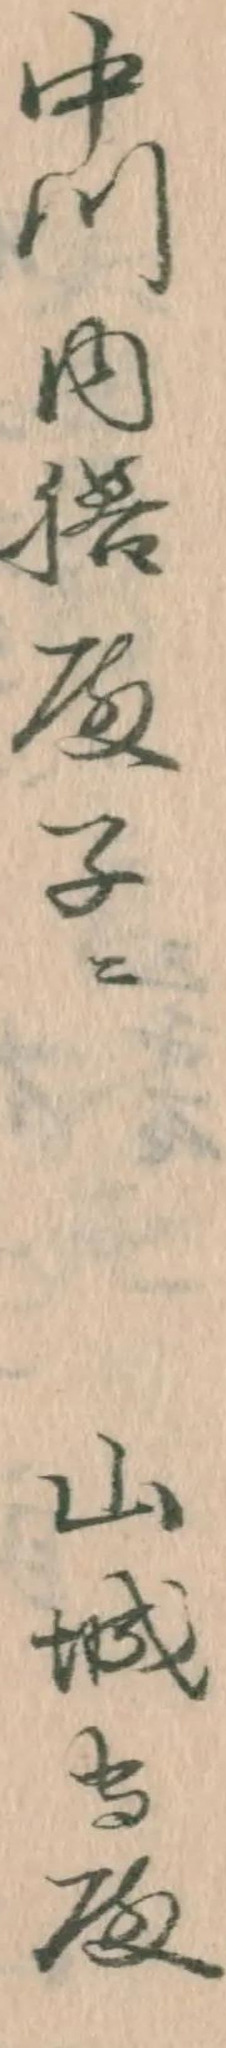中川内膳殿子に山城守殿
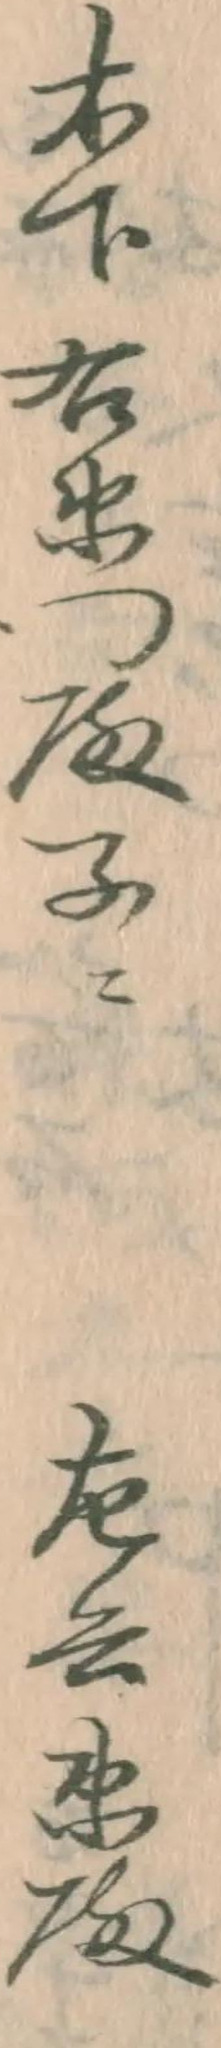木本右衛門殿子に左兵衛殿
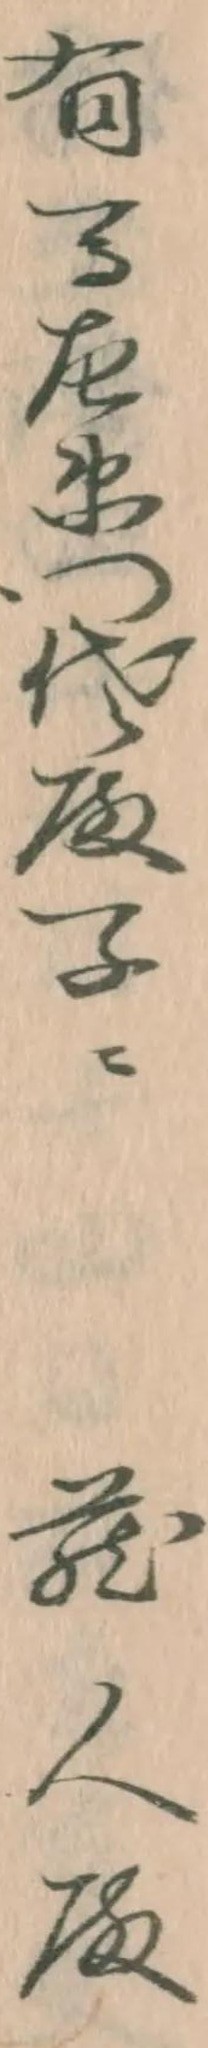有馬左衛門佐殿子に蔵人殿
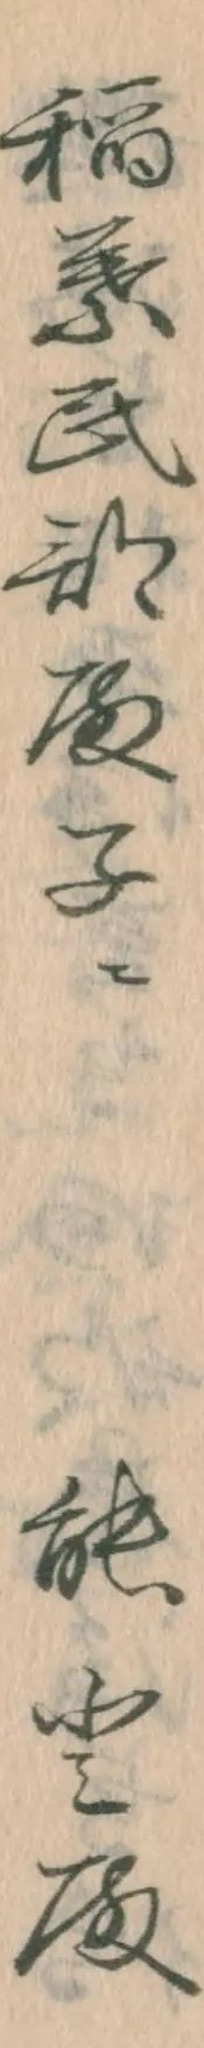稲葉民部殿子に能登殿
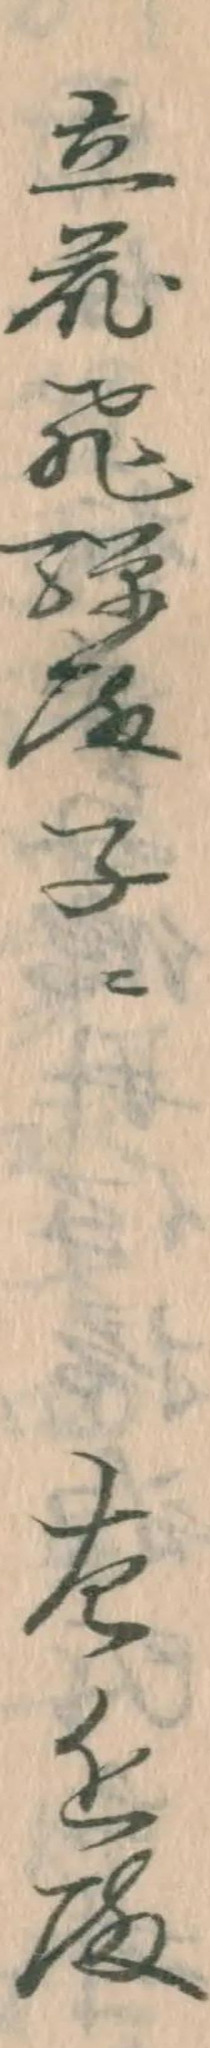立花飛騨殿子に左近殿
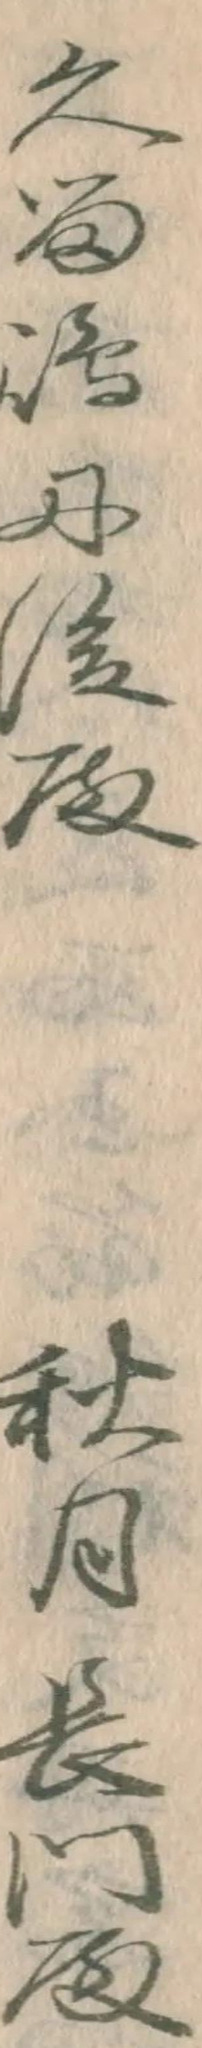久留島丹後殿秋月長門殿
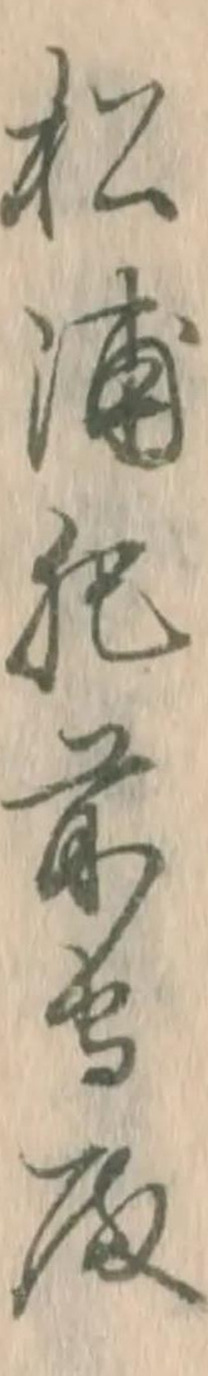松浦肥前守殿
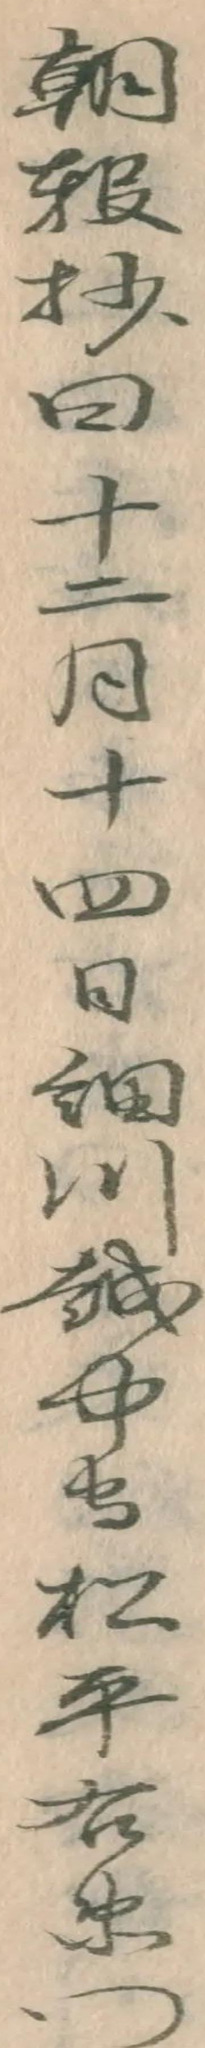朝報抄曰十二月十四日細川越中守松平右衛門

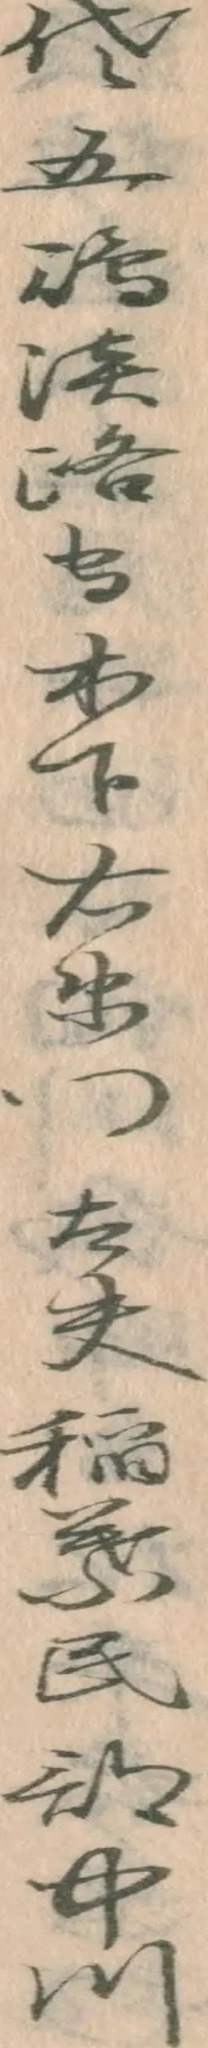佐五島淡路守木下右衛門太夫稲葉民部中川
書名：切支丹御退治記 49巻. [2]
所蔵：国立国会図書館 National Diet Library, JAPAN
